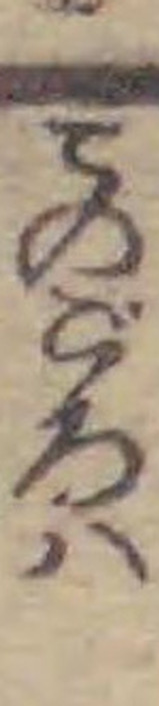このごろは
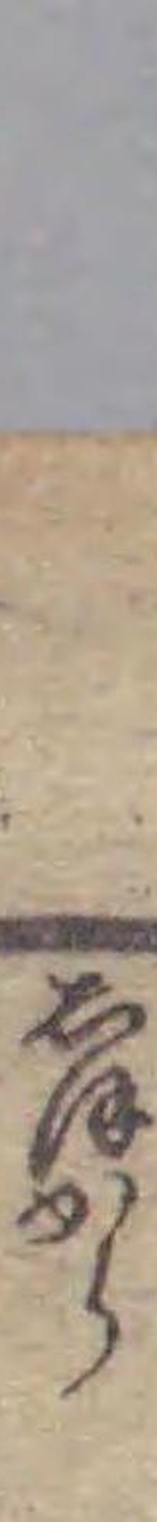しほから
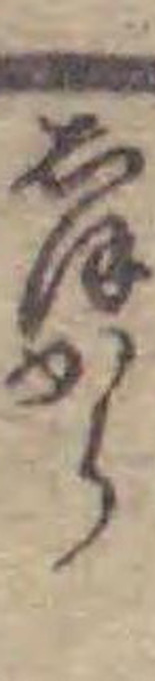しほから
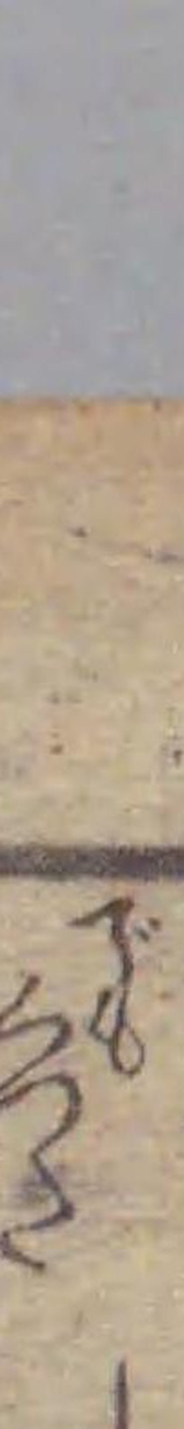くつた
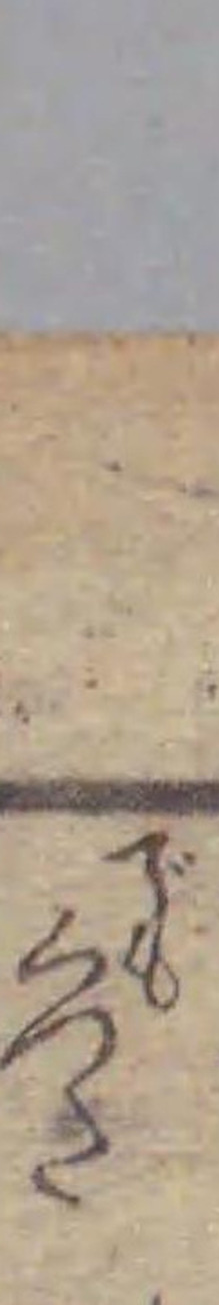くつた
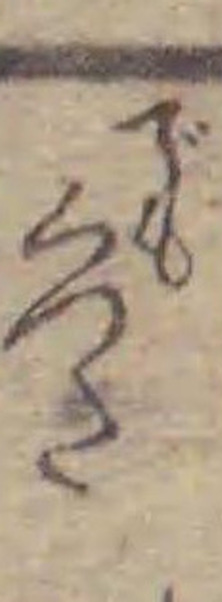くつた
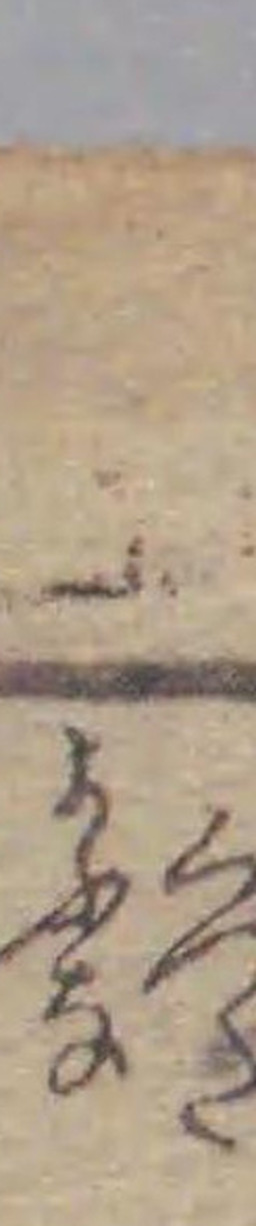よふな
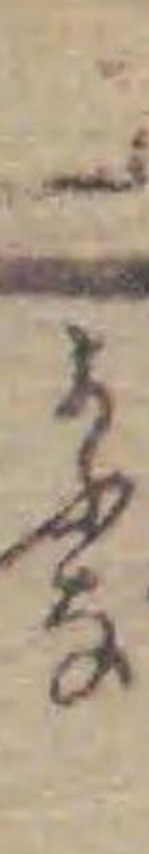よふな
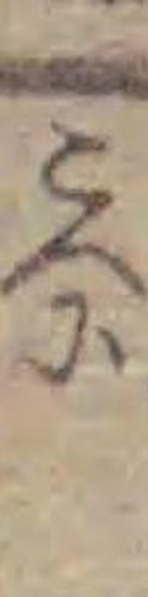こへに
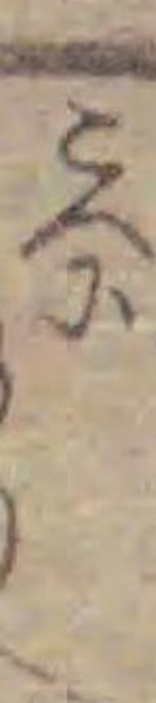こへに

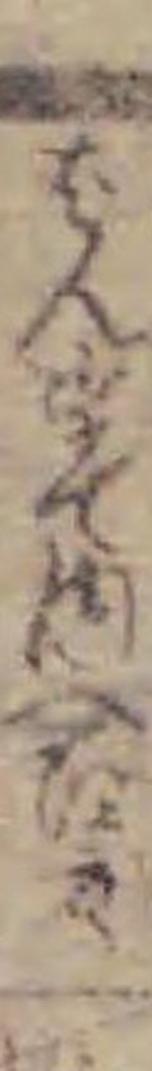はんまて内へ百度
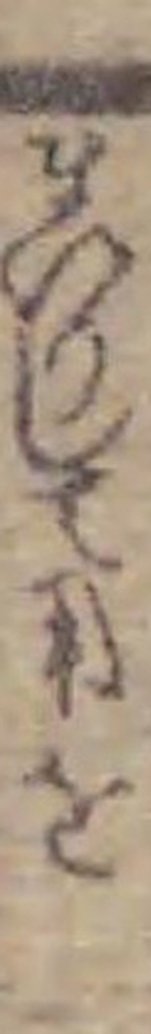まいりして用を
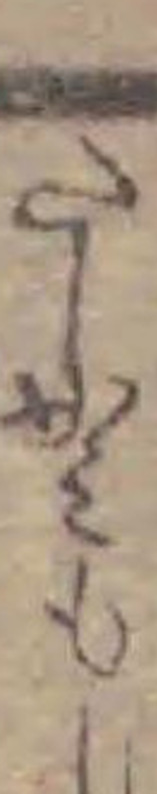たしかみも
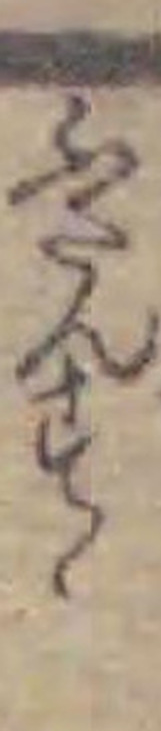ふたんすゝ
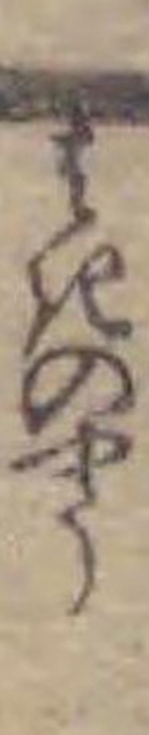はきのやう
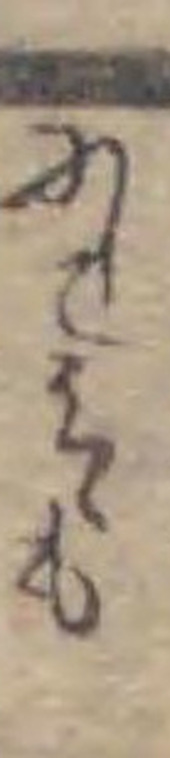にしてみゝも
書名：通風伊勢物語 : 3巻
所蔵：国立国会図書館 National Diet Library, JAPAN
